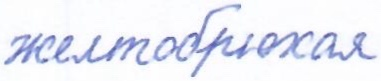желтобрюхая
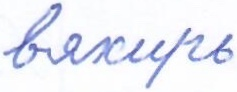вяхирь
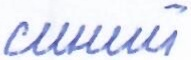синий
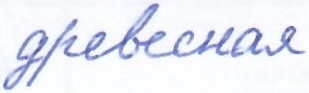древесная
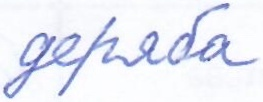деряба
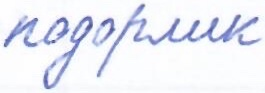подорлик
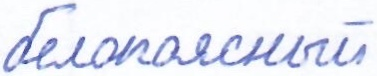белопоясный
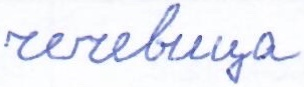чечевица
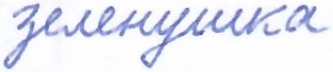зеленушка
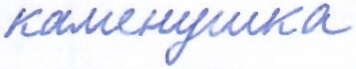каменушка
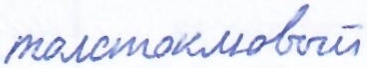толстоклювый
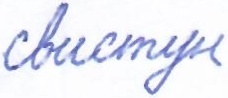свистун
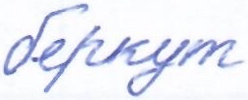беркут
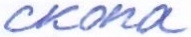скопа
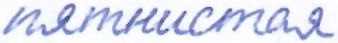пятнистая
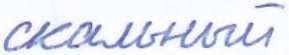скальный
